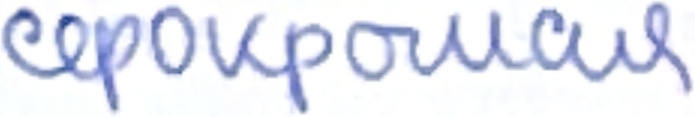серокрымая
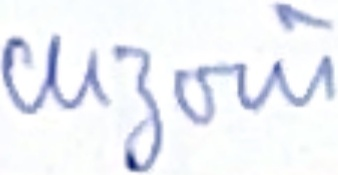сизый
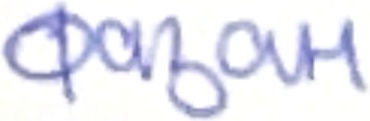фазан
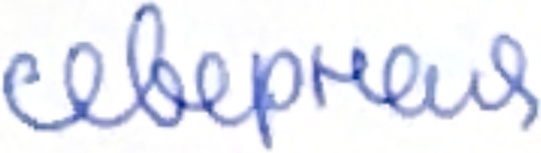северная
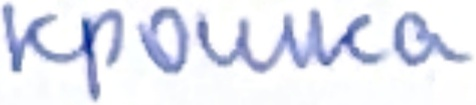крошка
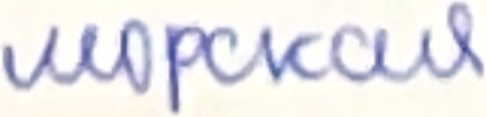морская
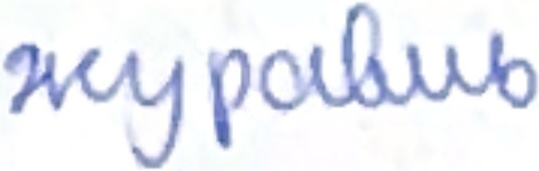журавмь
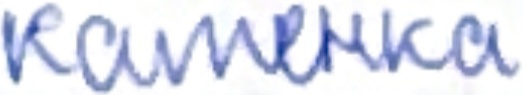каменка
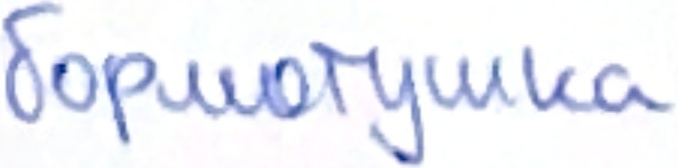бормотушка
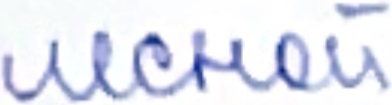лесной
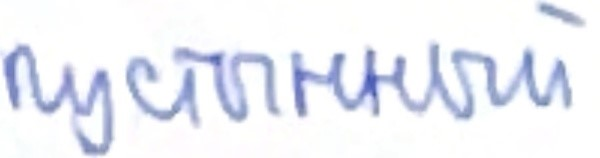пустынный
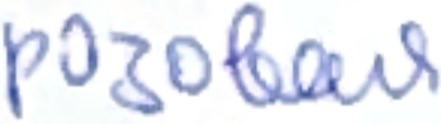розовая
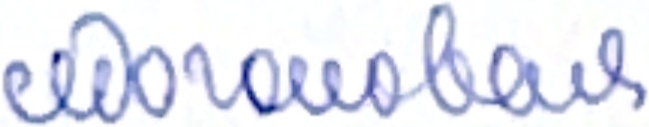седоголовая
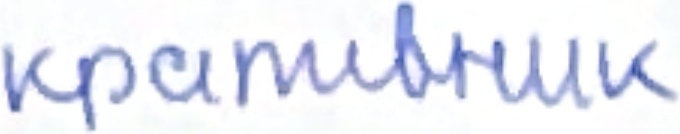крапивник
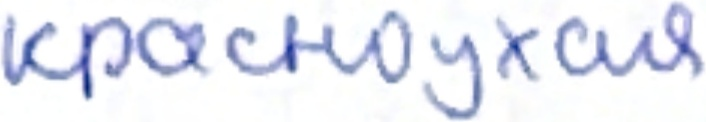красноухая
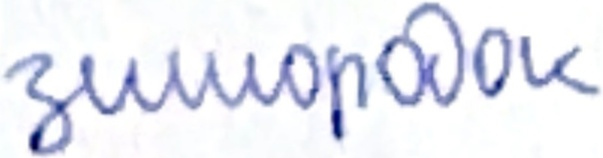зимородок
